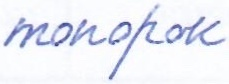топорок
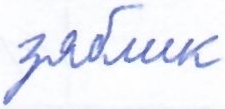зяблик
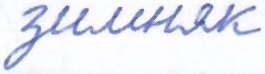зимняк
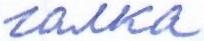галка
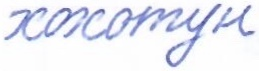хохотун
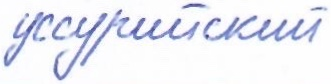уссурийский
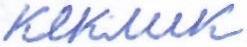кеклик
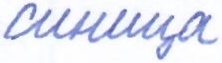синица
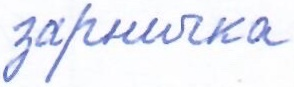зарничка
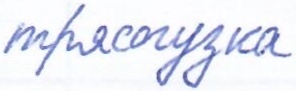трясогузка
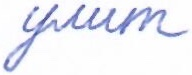улит
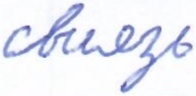свиязь
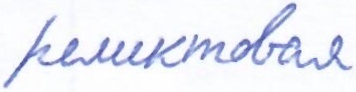реликтовая
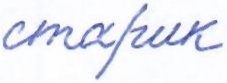старик
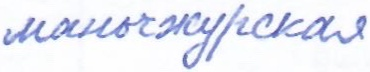маньчжурская
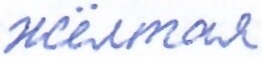жёлтая
